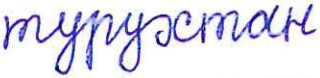турухтан
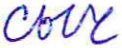сыч
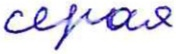серая
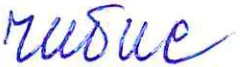чибис
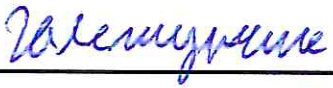галстунчик
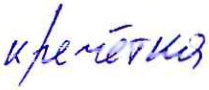кречётка
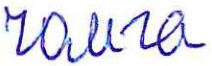чомга
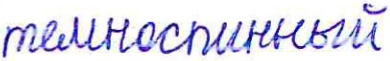темноспинный
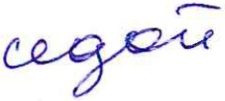седой
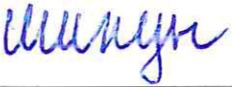шипун
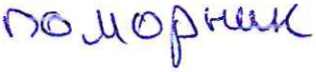поморник
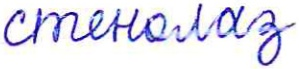стенолаз
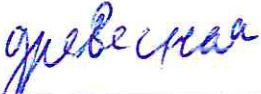древесная
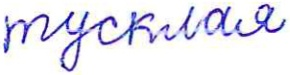тусклая
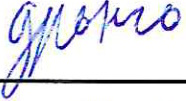дронго
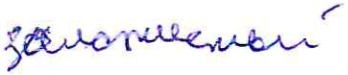залотистый
